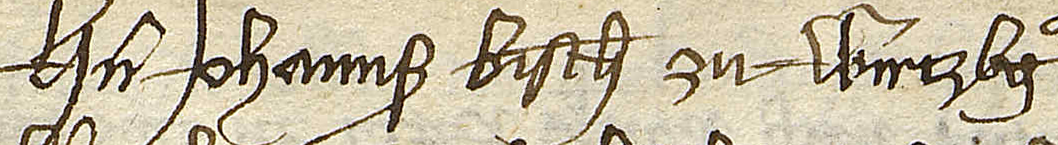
Hn* Iohannſ* biſch* ʒu Wircʒb*g
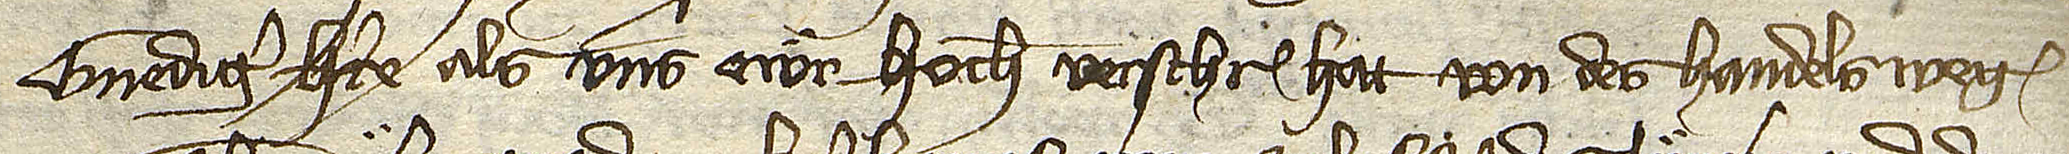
Gnedig* H*re als vns eẅr hoch* verſchr* hat von des handels weg*
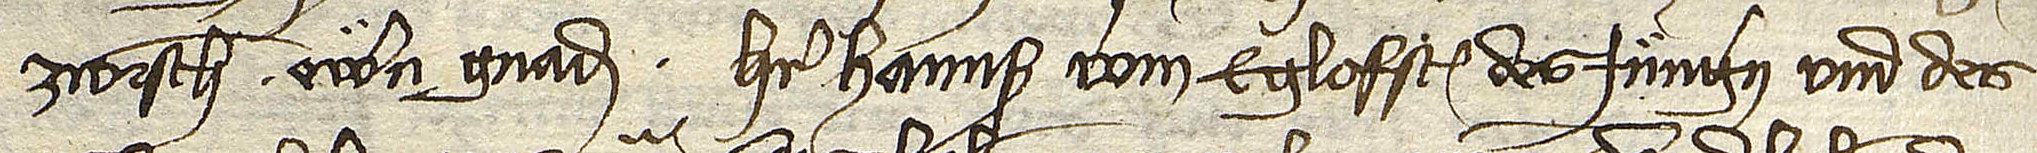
ʒwiſch* . eẅ*n gnad* . hr* hannſ* vom Eglofſt* des Iüng*n vnd des
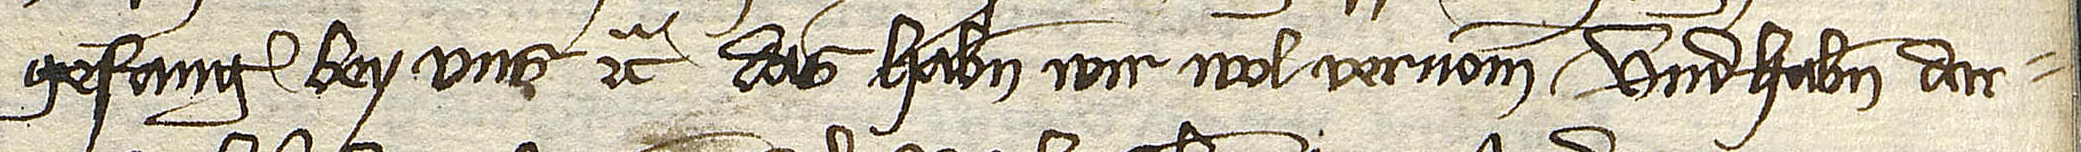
gefang* bey vns ec* das habn* wir wol vernom* / Vnd habn* dar =
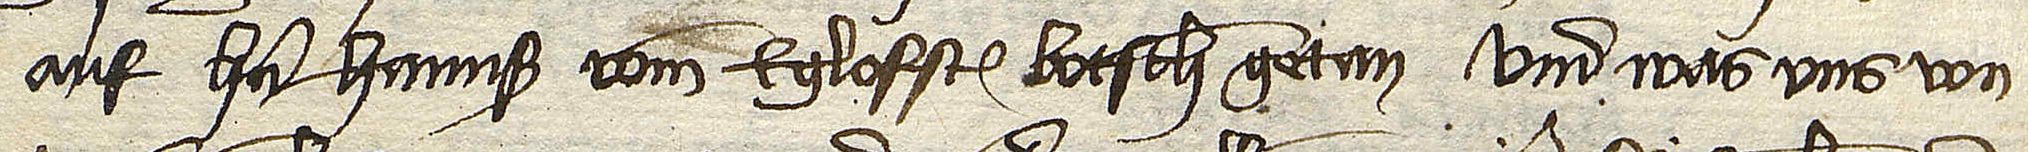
auf h*n hannſ* vom* Eglofſt* botſch* getan vnd was vns von
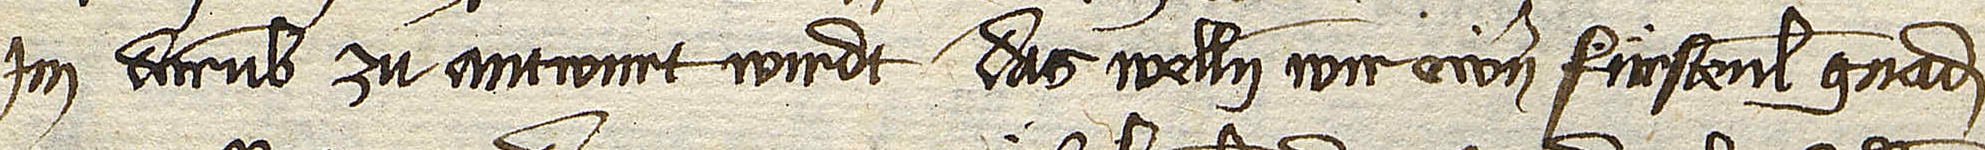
Im darub* ʒu antwurt wirdt / das welln* wir eẅ*n fürſtenl* gnad*
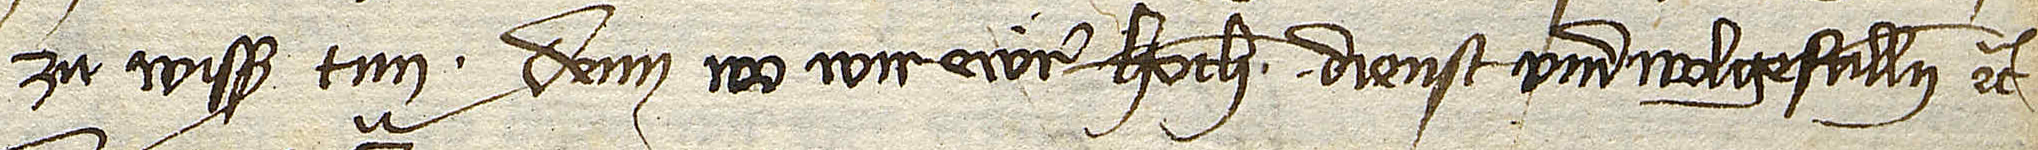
ʒu wiſſ* tun . Denn wo wir eẅr* hoch* . dienſt vnd wolgefalln* ec*
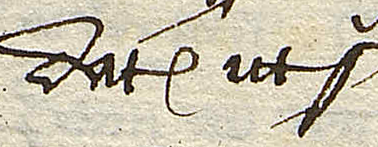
Dat* ut ſ*
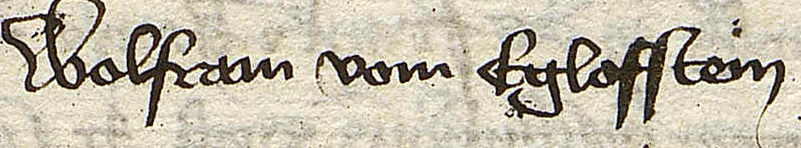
Wolfram vom Eglofſtein
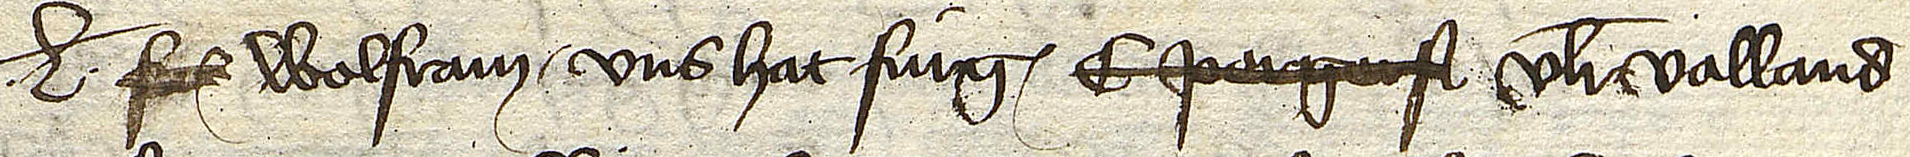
. L* . fr* wolfram / vns hat fürg* C pergerſt vlr* volland
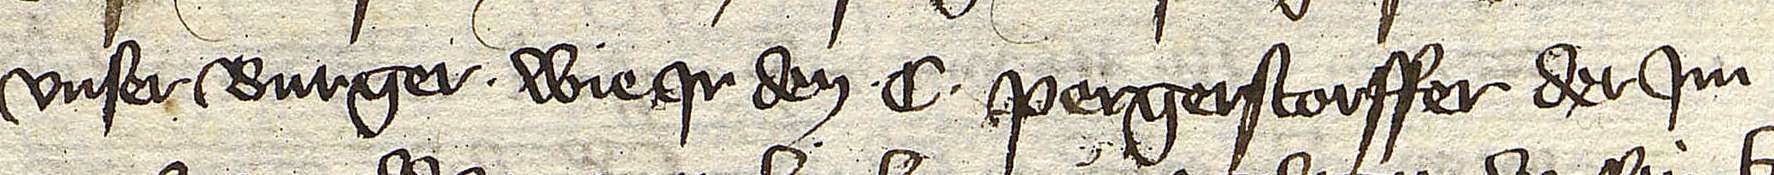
vnſer Burger . wie Ir den . C. Pergerſtorffer der Im
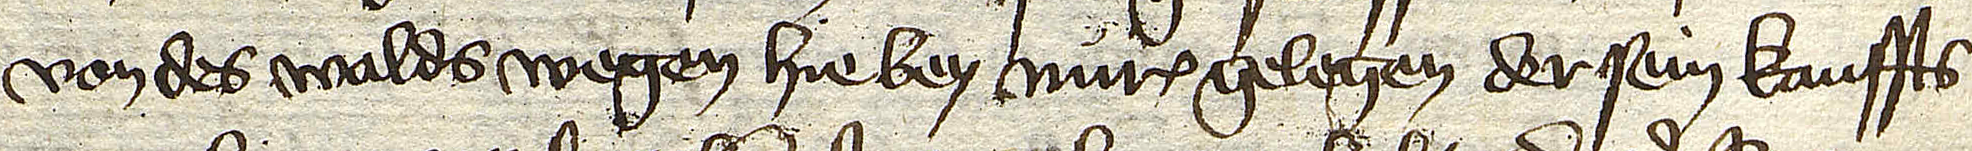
von des walds wegen hie bey nür* gelegen der ſein kauffts
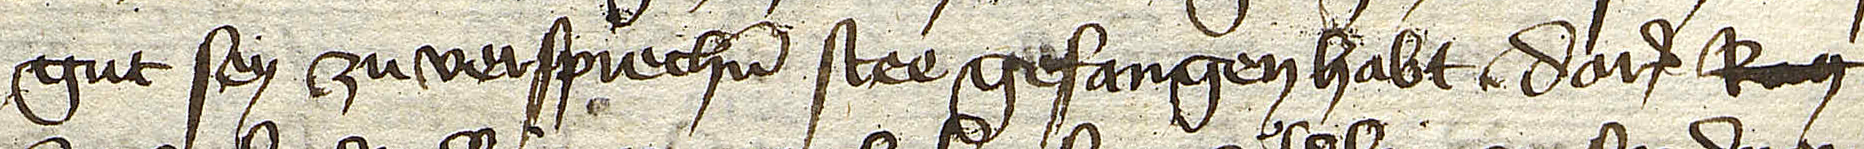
gut ſey cʒuverſprechn* ſtee gefangen habt / Dar* Ro*
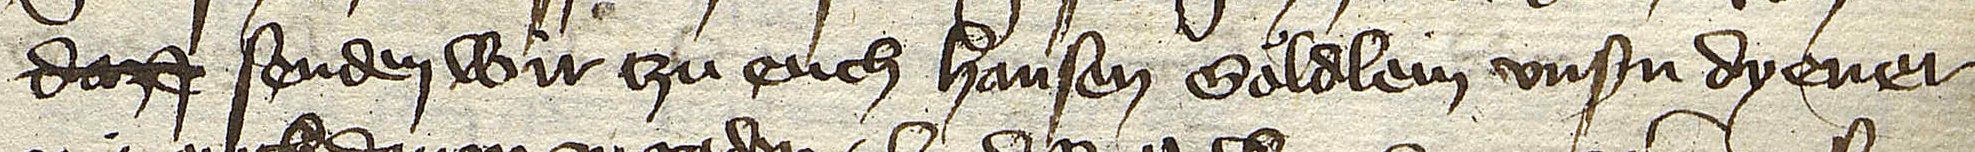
daʒ I ſenden wir cʒu euch hanſen Göldlein vnſ*n dyener
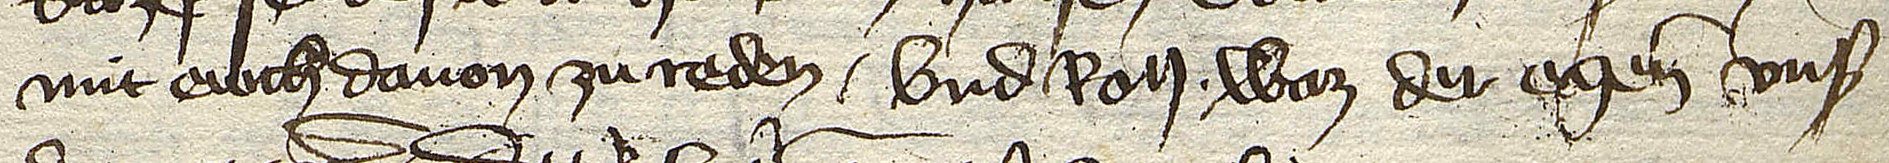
mit ewch dauon cʒu reden / Vnd Ro* . waʒ der egen* vnſ*
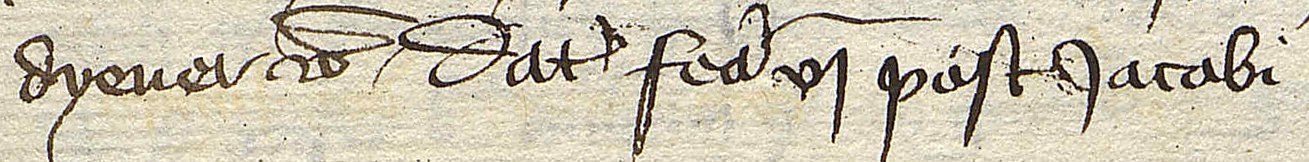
dyener ec* / Dat* fea* vi* poſt Iacobi
